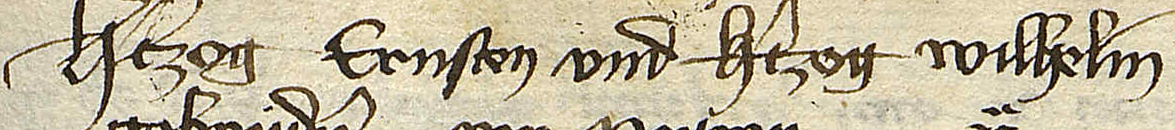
H*cʒog Ernſten vnd Hcʒog* wilhelm*
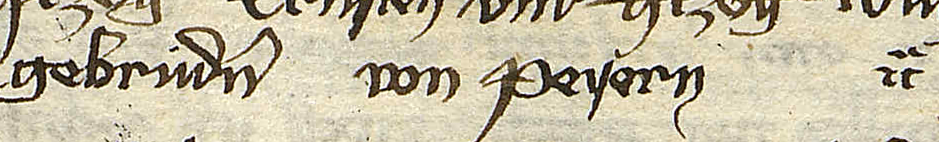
gebrüd*n von Peyern ec*
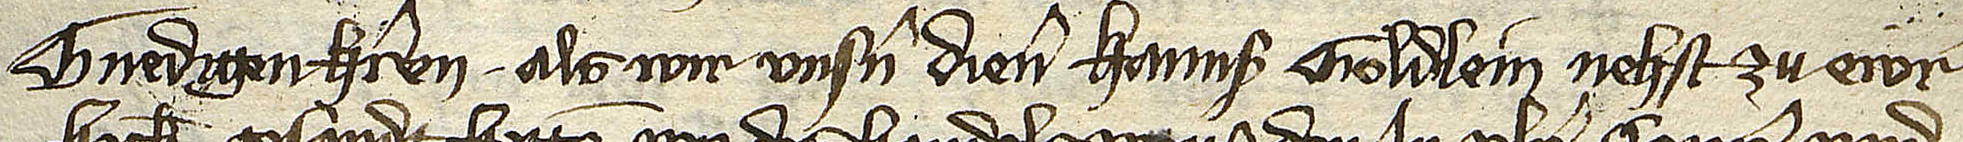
Gnedigen h*ren . als wir vnſ*n dien* hannſ* Göldlein nehſt ʒu ew*r
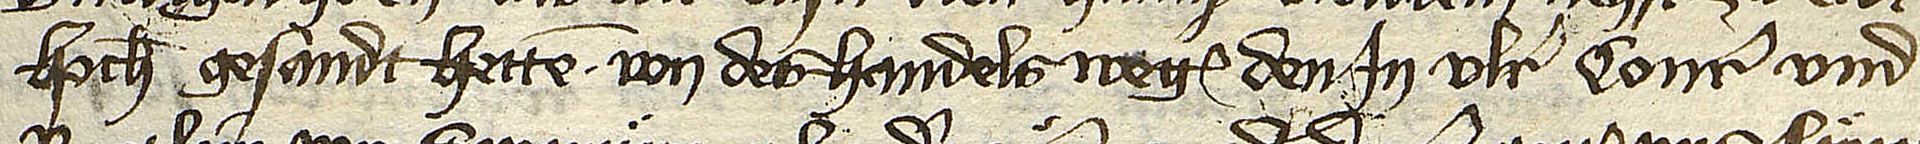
hoch* geſandt hette* . von des handels weg* den In vlr* Conr* vnd
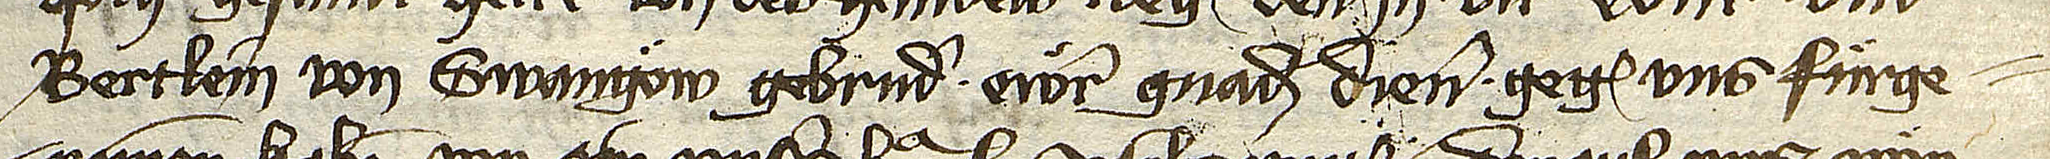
Bertlein von Swangöw gebrud* . ew*r gnad* dien* . geg* vns fürge =
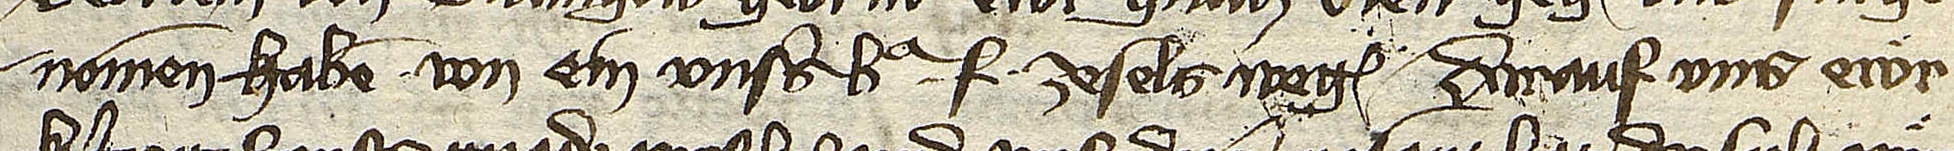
nomen* habe* . von ein vnſ*s B* . f . ʒeſels weg* / Darauf vns ewr
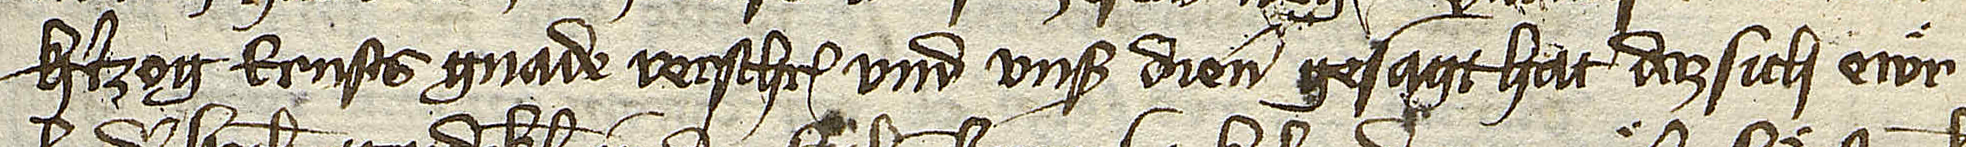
h*cʒog Ernſts gnade verſchr* vnd vnſ* dien* geſagt hat daʒ ſich ewr
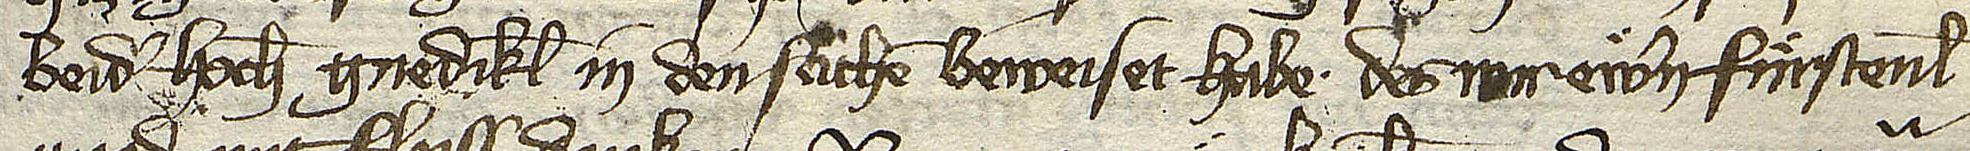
beid* hoch* gnedikl* in den ſache* beweiſet habe . des wir ew*n fürſtenl*
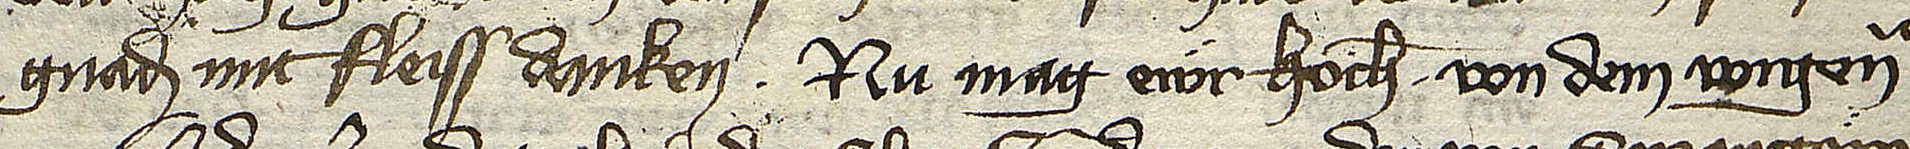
gnad* mit fleiſſ danken . Nu mag ewr hoch* . von dem vorgen*
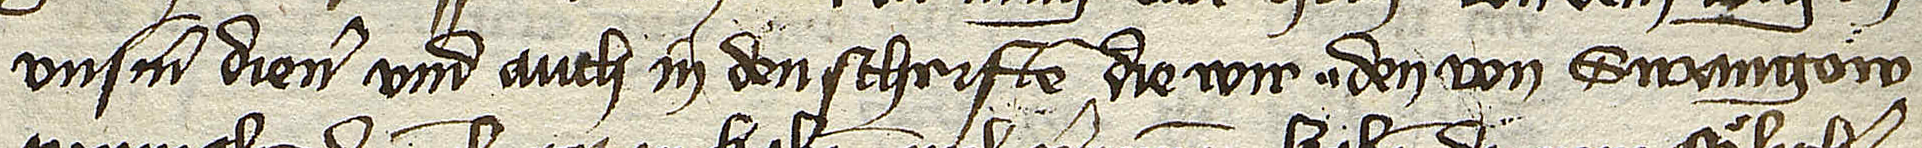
vnſ*m dien* vnd auch in den ſchrifte* die wir ~ den von Swangöw
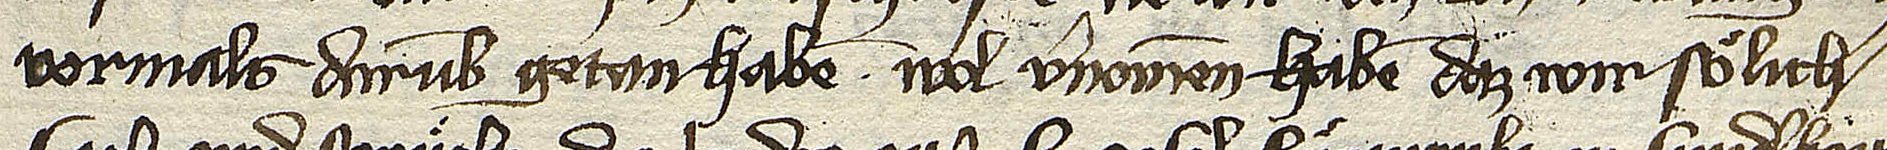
vormals darub* getan habe* . wol v*nomen* habe* daʒ wir ſölich*
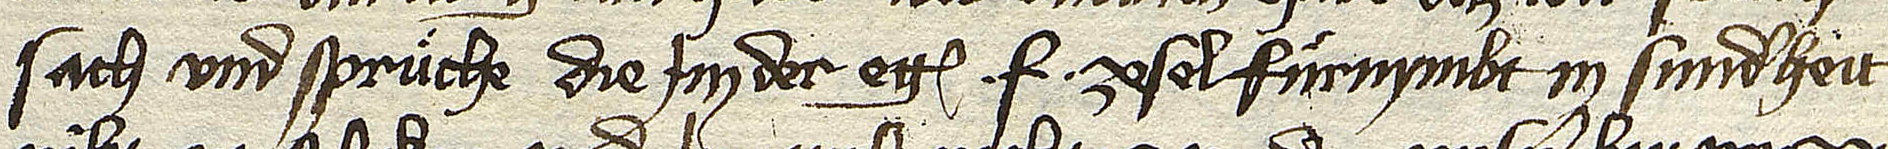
ſach vnd ſprüche die Im der eg* . f . ʒeſel fürnymbt in ſund*heit
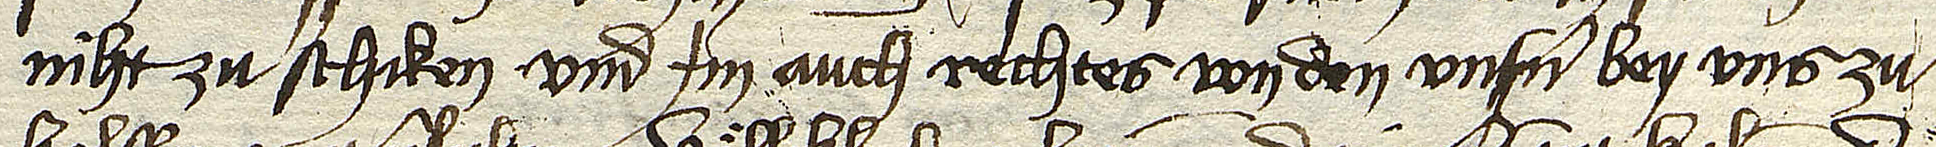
niht ʒu ſchiken vnd Im auch rechtes von den vnſ*n bey vns ʒu
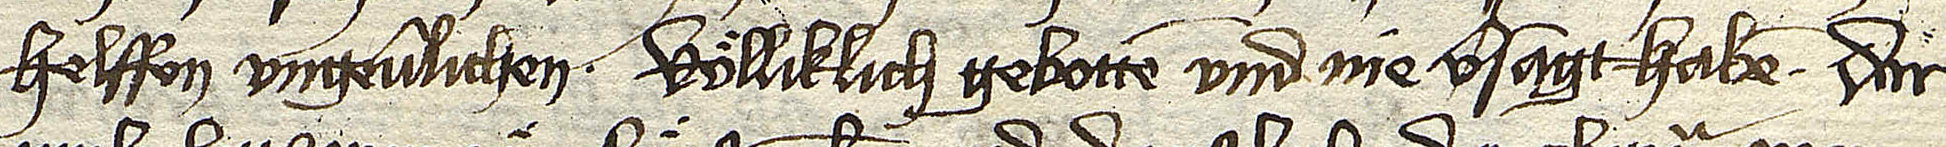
helffen vngeulichen* . Völliklich gebotte* vnd nie v*ſagt habe* . Dar -
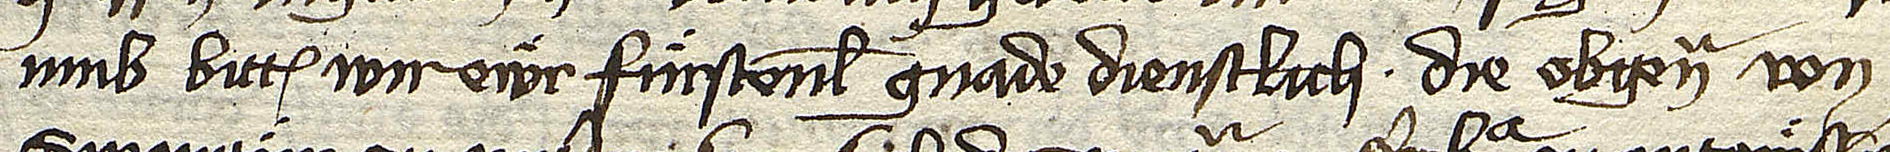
umb bitt* wir ewr fürſtenl* gnade dienſtlich . die obgen* von
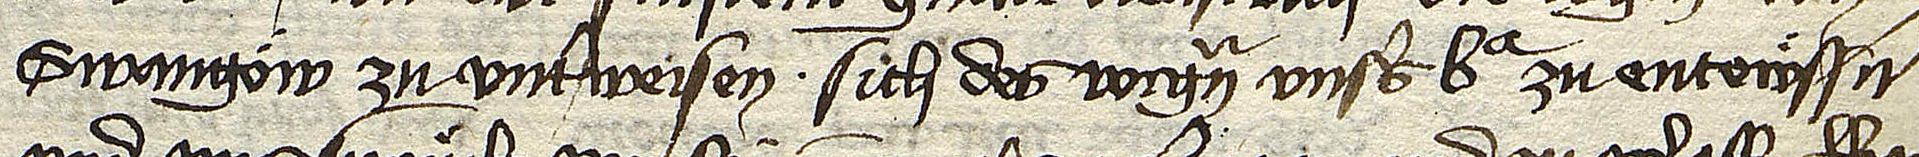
Swangöw ʒu vnt*weiſen . ſich des vorgn* vnſ*s b* ʒu entewſſ*n
